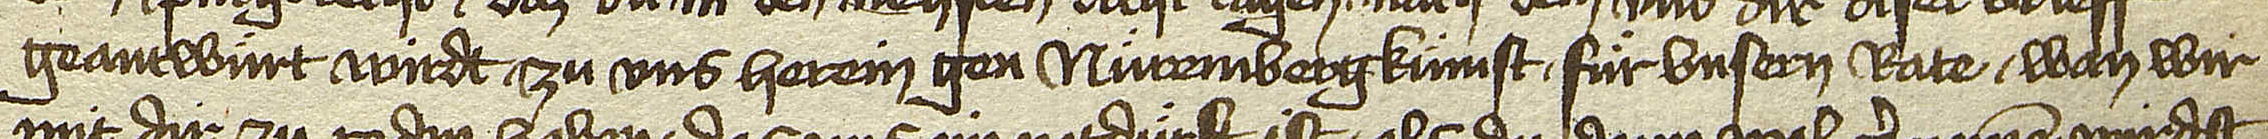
geantwürt wirdt / cʒu vns herein gen Nüremberg kümſt / für vnſern Rate / wan wir
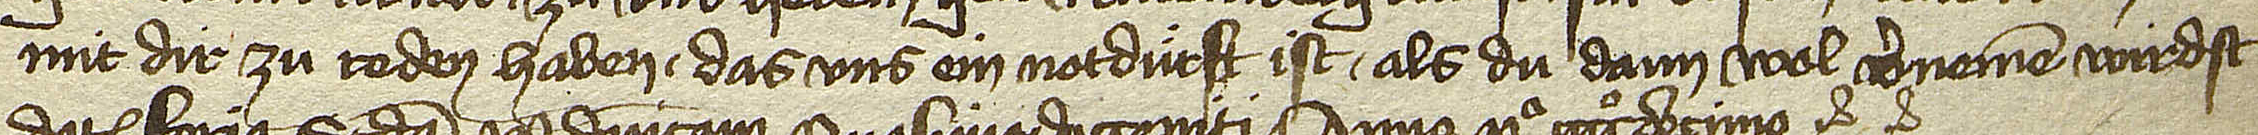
mit dir cʒu reden haben / das vns ein notdürft iſt / als du dann wol v*neme wirdſt
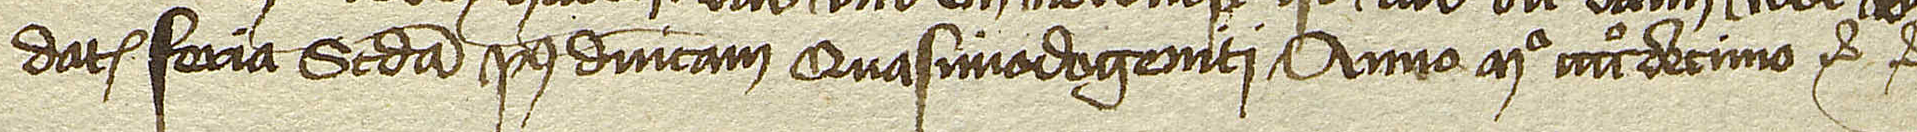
dat* feria Scda* p* dnicam* Quaſimodogeniti / Anno M* cccc* decimo § §
